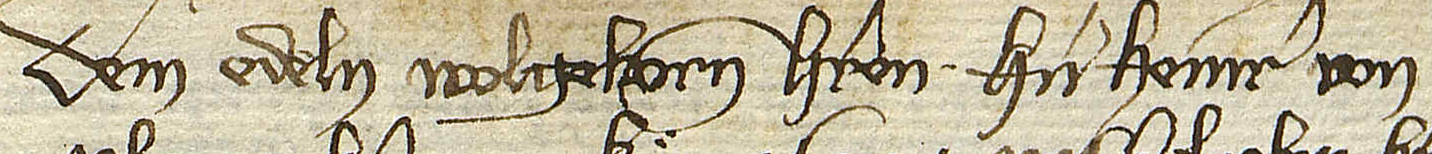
Dem edeln wolgeborn* h*ren . h*n Heinr* von
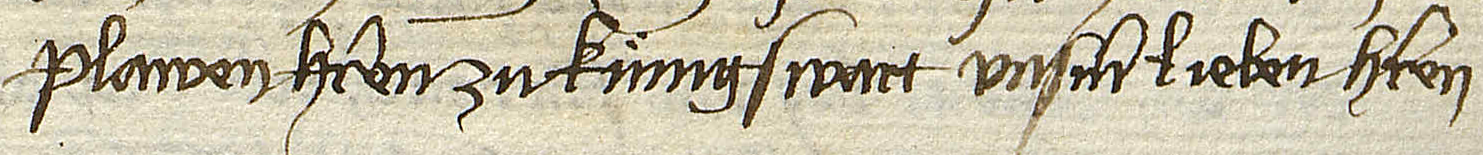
Plawen h*ren ʒu künigſwart vnſ*m lieben h*ren
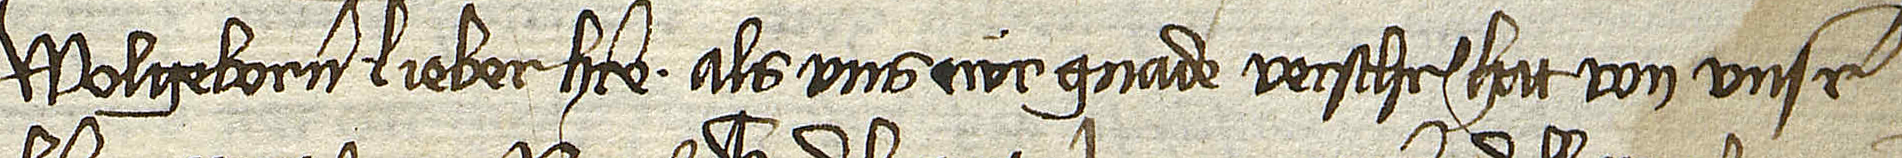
Wolgeborn* lieber h*re . als vns ewr gnade verſchr* hat von vnſ*r
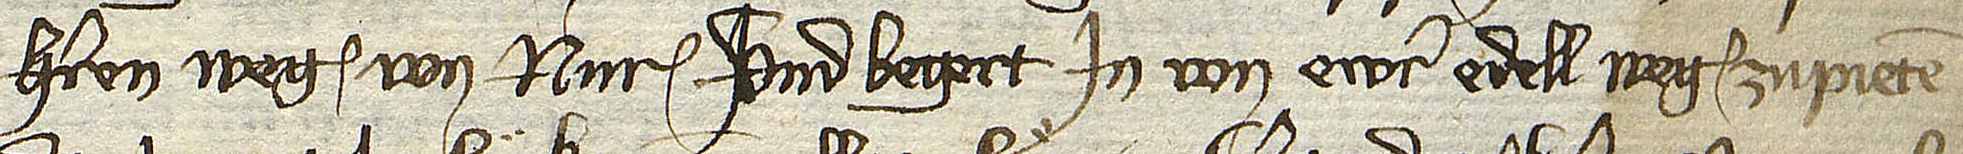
h*ren weg* von Nur* / Vnd begert In von ewr edell weg* ʒu piete*
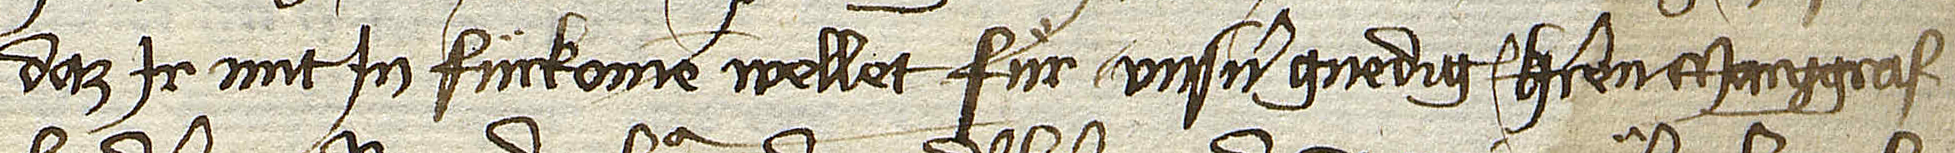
daʒ Ir mit In fürkome* wellet für / vnſ*n gnedig* h*ren Marggraf
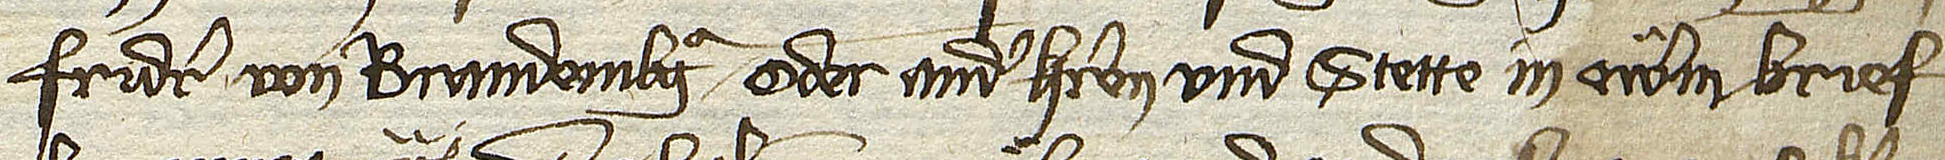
fridr* von Brandemb*g / oder and* h*ren vnd Stette in ew*m brief
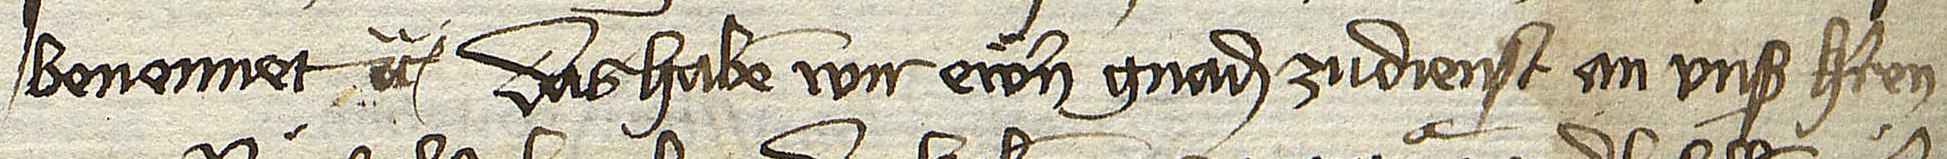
benennet ec* Das habe* wir ew*n gnad* ʒudienſt an vnſ* h*ren
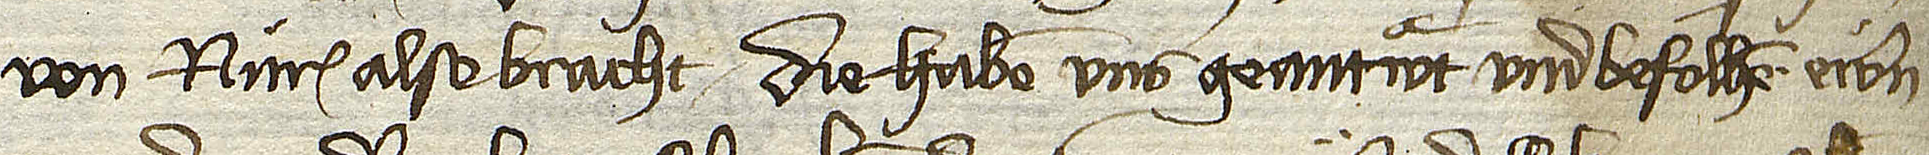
von Nür* alſo bracht / Die habe* vns geantw*t vnd befolhe* . ew*n
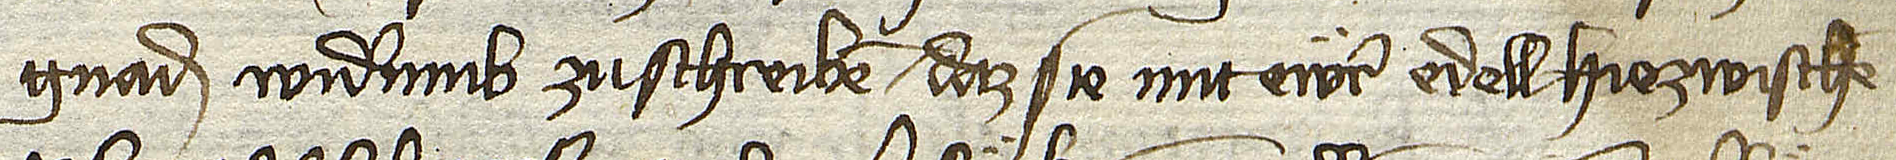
gnad* wid*umb ʒuſchreibe* / daʒ ſie mit ew*r edell hieʒwiſche*
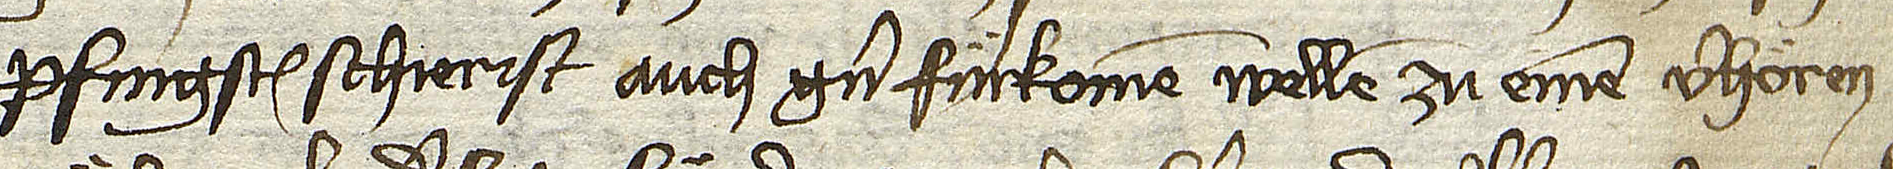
Pfingſt* ſchieriſt auch g*n fürkome* welle* ʒu eine* v*hören
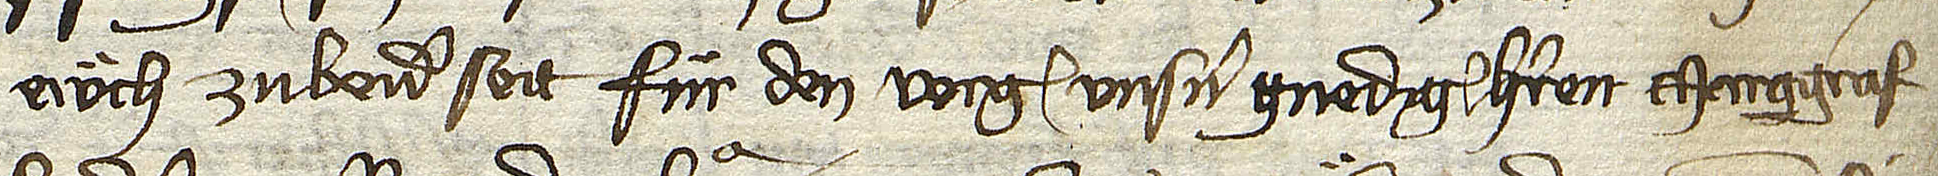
ewch ʒubeid* ſeit für den vorg* vnſ*n gnedig* h*ren Marggraf
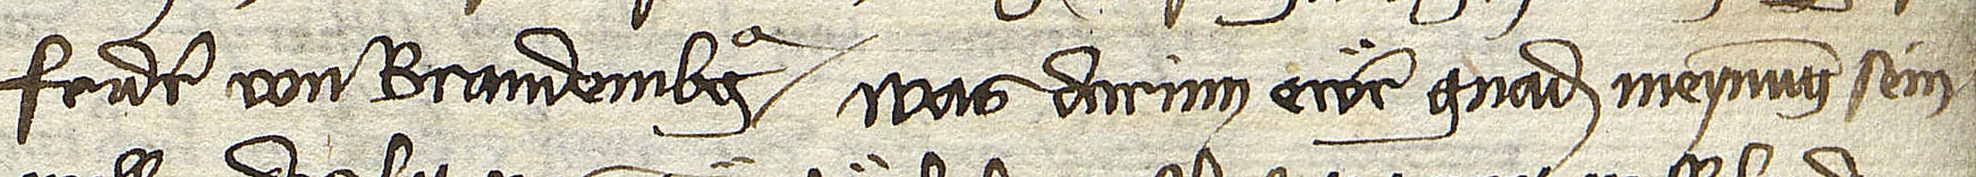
fridr* von Brandemb*g / was darinn ew*r gnad* meynu*g ſein
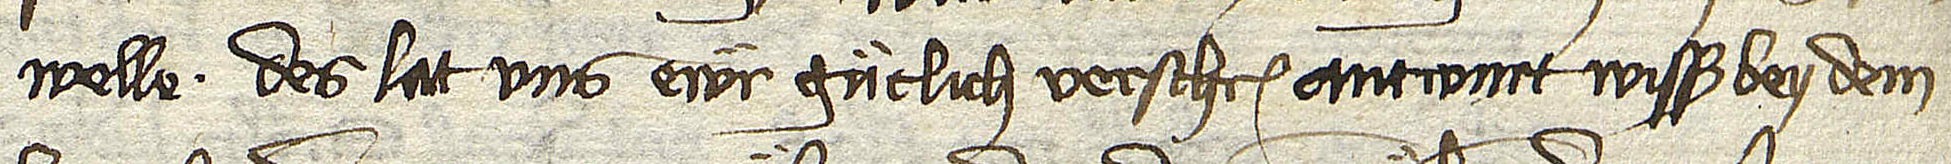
welle . Des lat vns ewr gütlich verſchr* antwurt wiſſ* bey dem
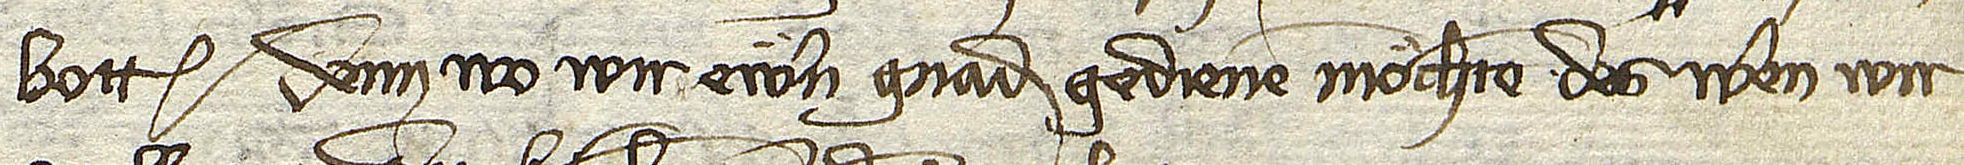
bott* / Denn wo wir ew*n gnad* gediene* möchte* . des we*n wir
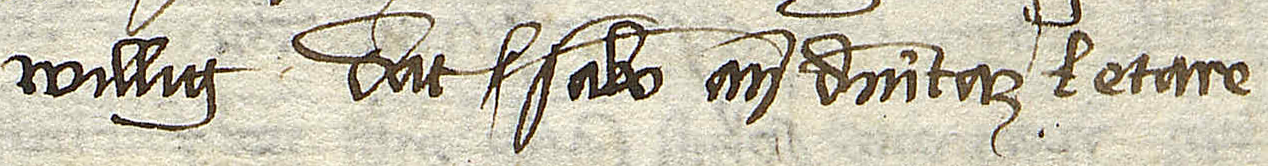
willig . Dat* ſabo* an* dnica* letare
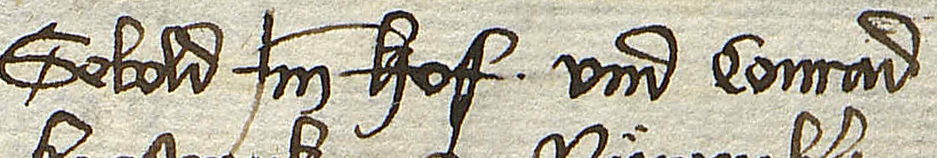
Sebold Im* Hof . vnd Conrad
